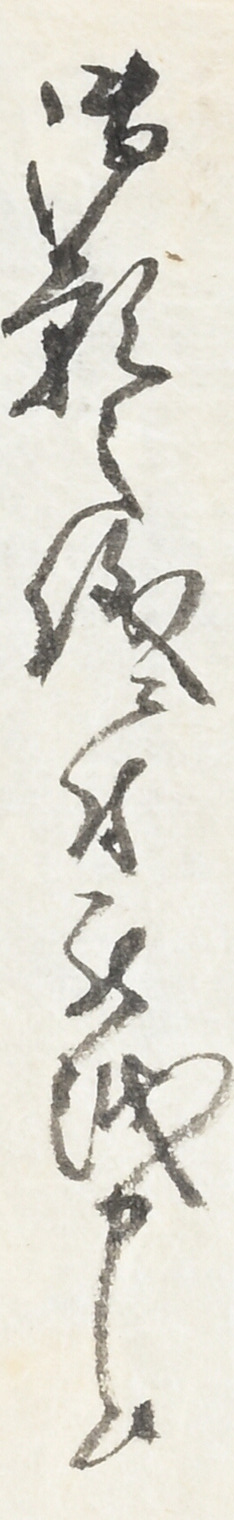御願之義ニ付罷越申候

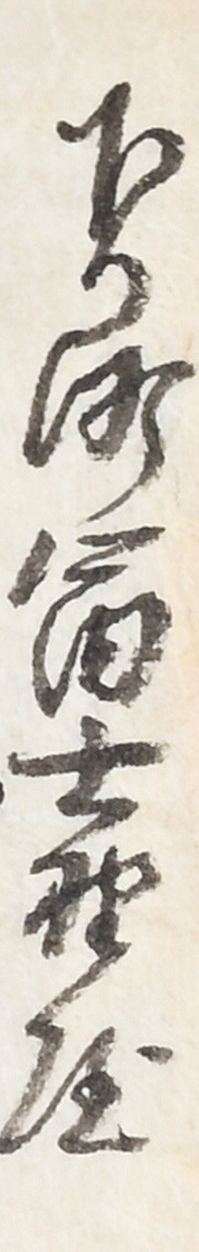下り町冨士野屋
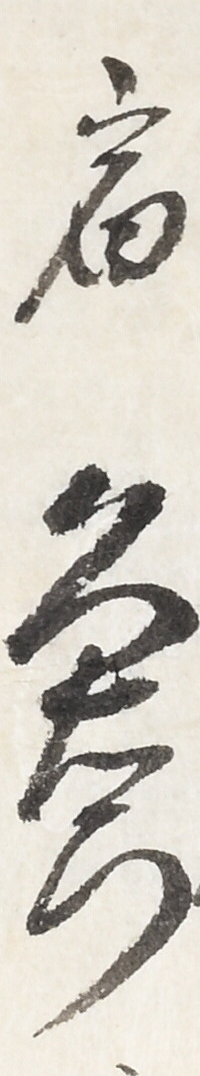宿久右衛門
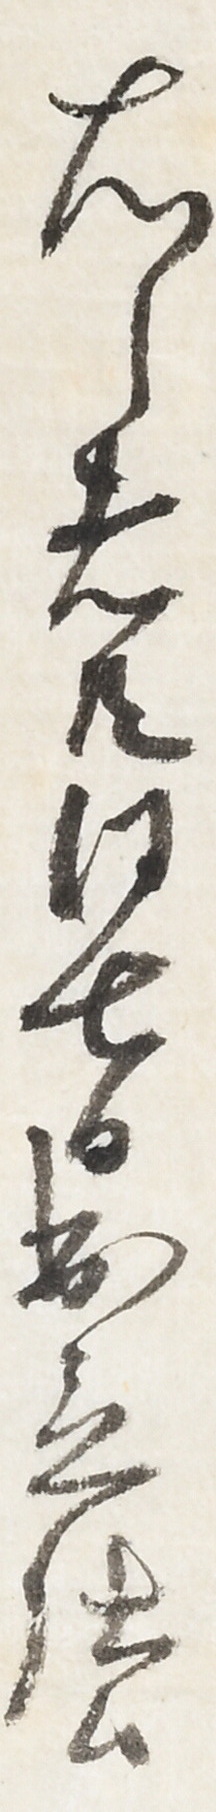右之者共同七日出立仕候
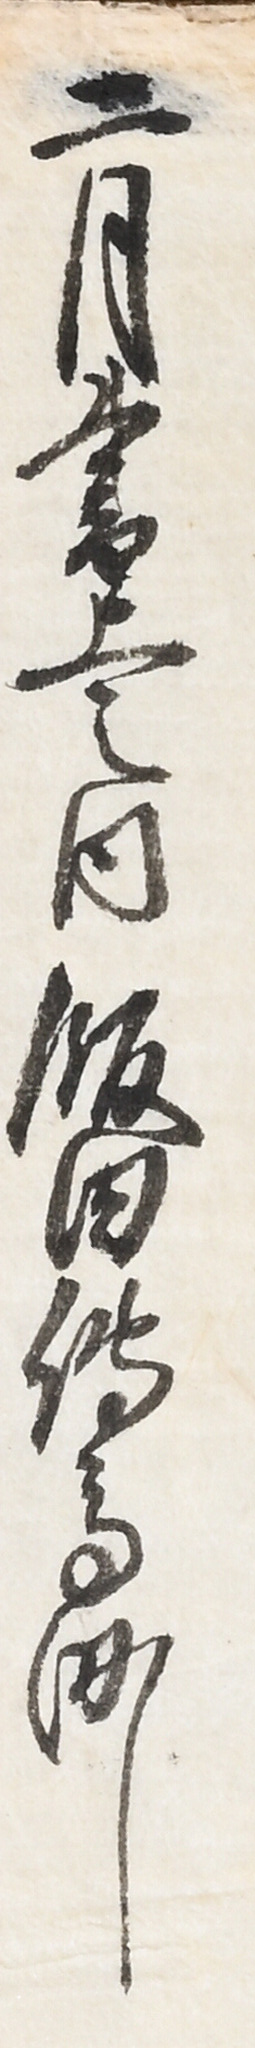二月書上之内飯田伝馬町
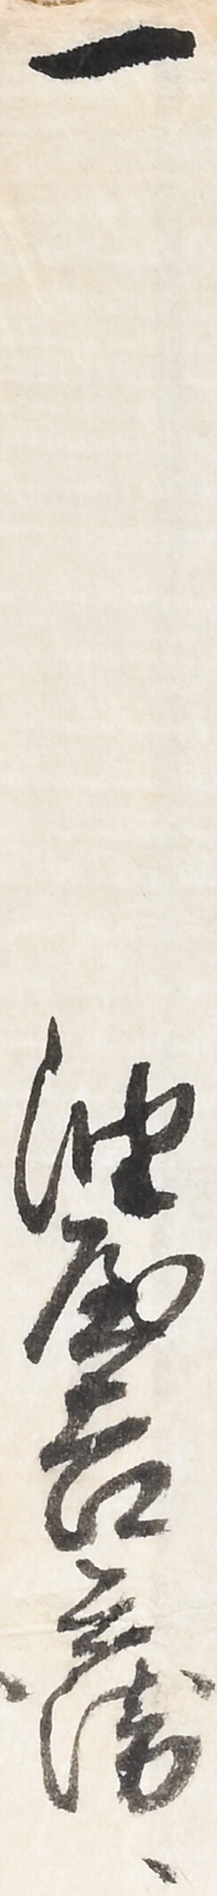一油屋吉兵衛・
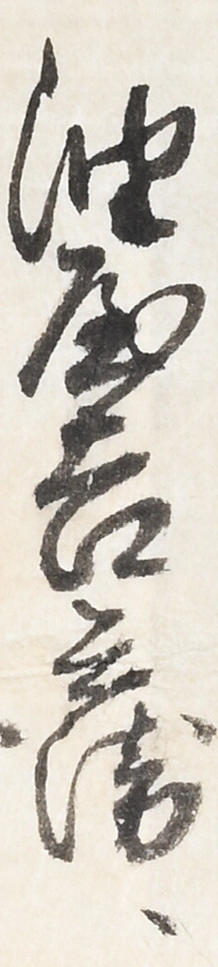一油屋吉兵衛・
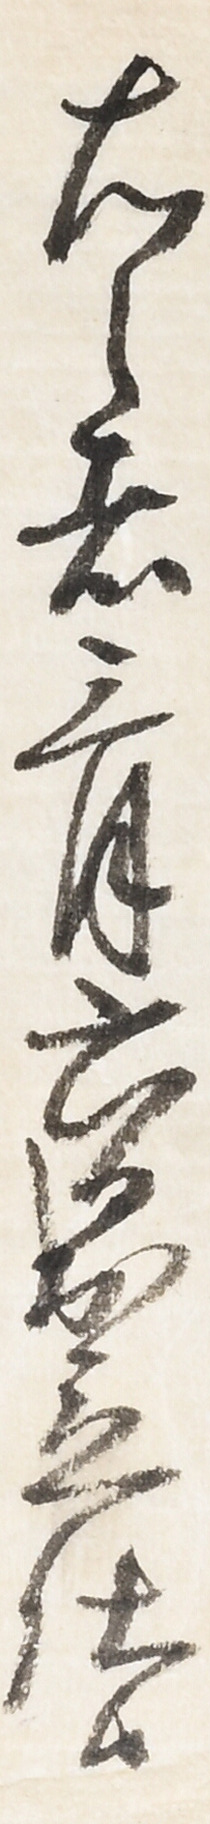右之者三月六日出立仕候
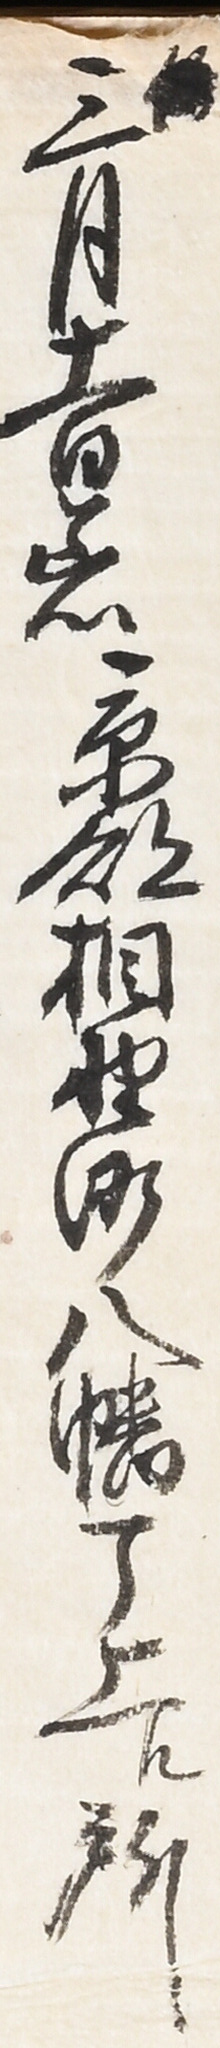三月十一日着京都相野町八幡丁上ル所
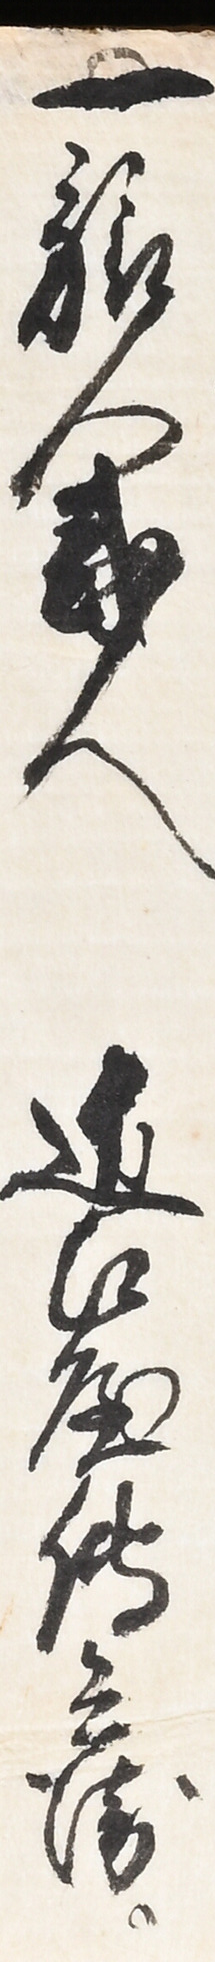一旅人弐人近江屋伝兵衛。
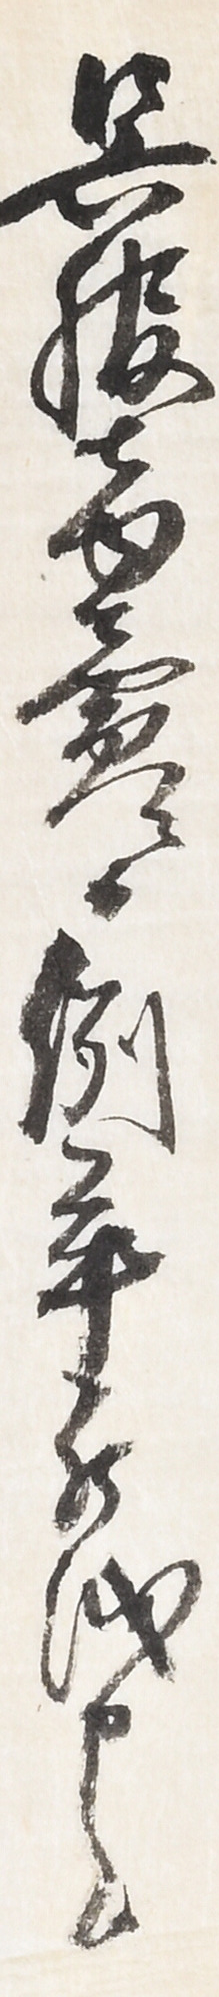呉服商売ニ而例年罷越申候
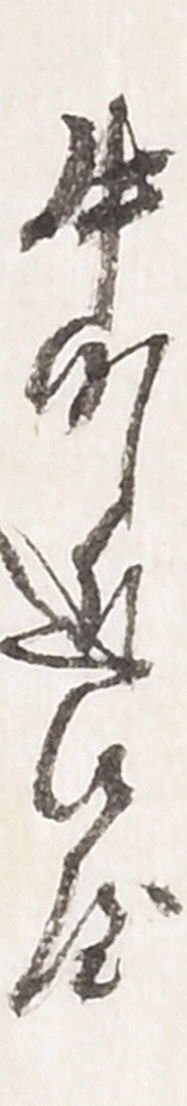中町近江屋
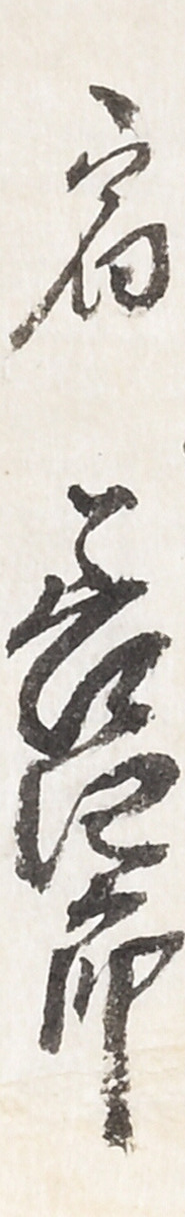宿善四郎
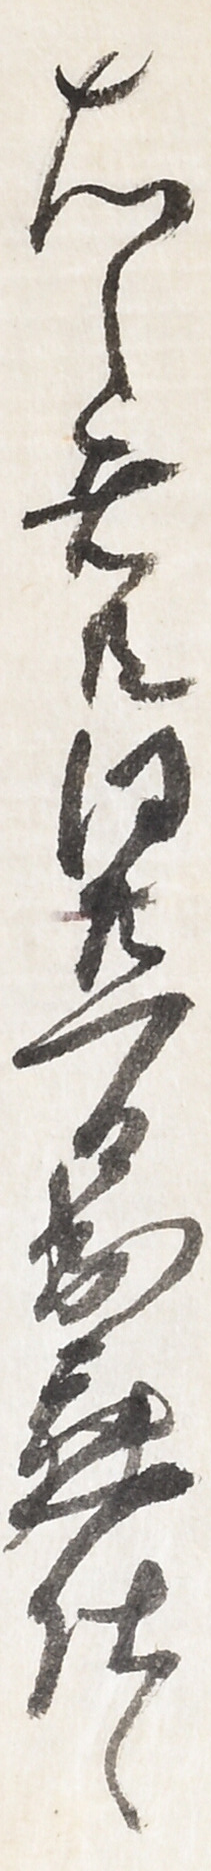右之者共同廿一日出立仕候
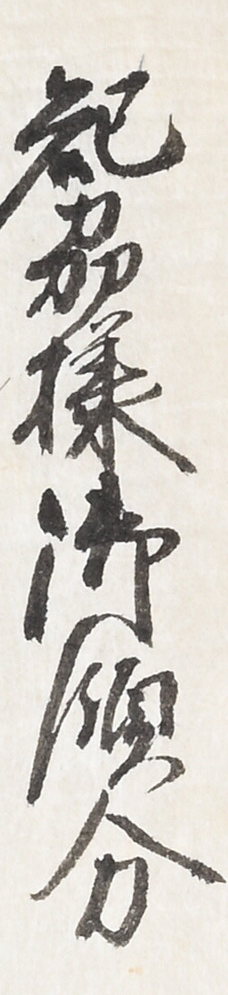紀州様御領分
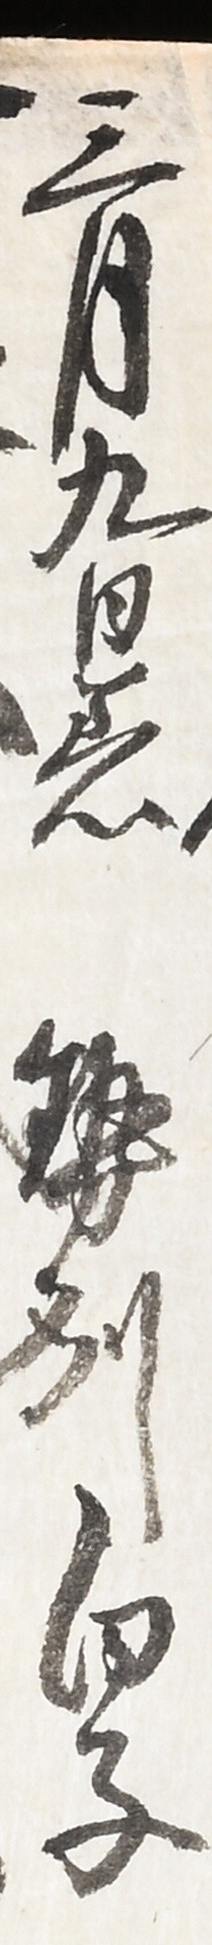三月九日着勢州白子
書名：旅人泊控帳
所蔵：伊那市立高遠町図書館・合同会社AMANE
